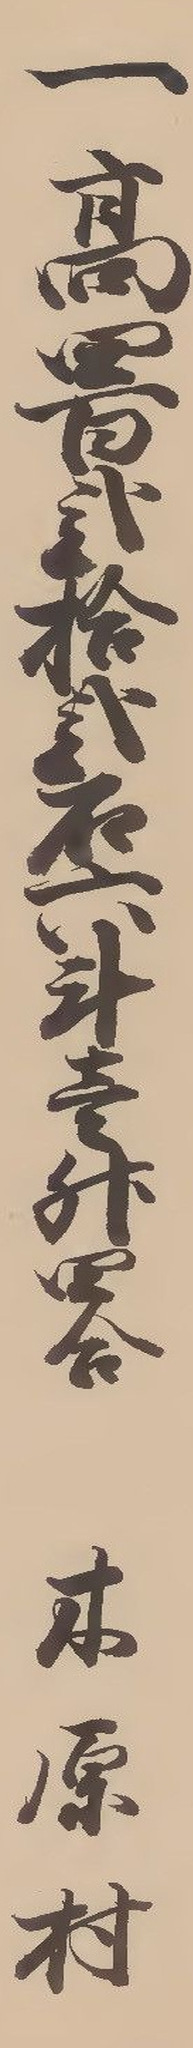一高四百弐拾弐石六斗壱升四合木原村
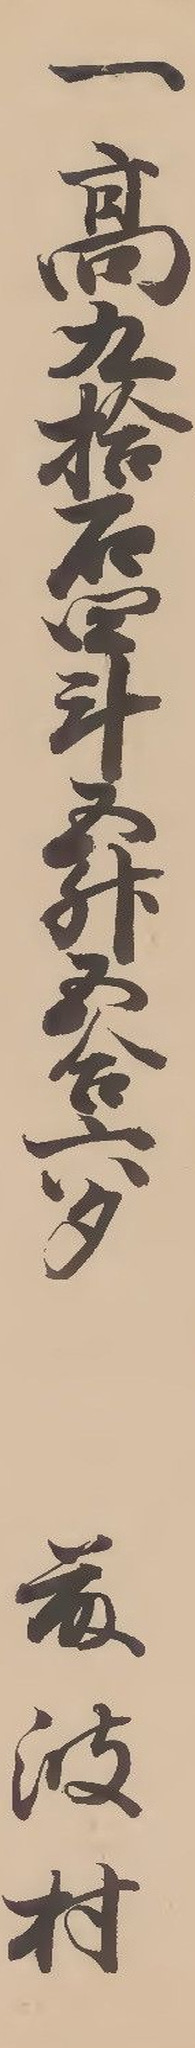一高九拾石四斗五升五合六勺藤波村
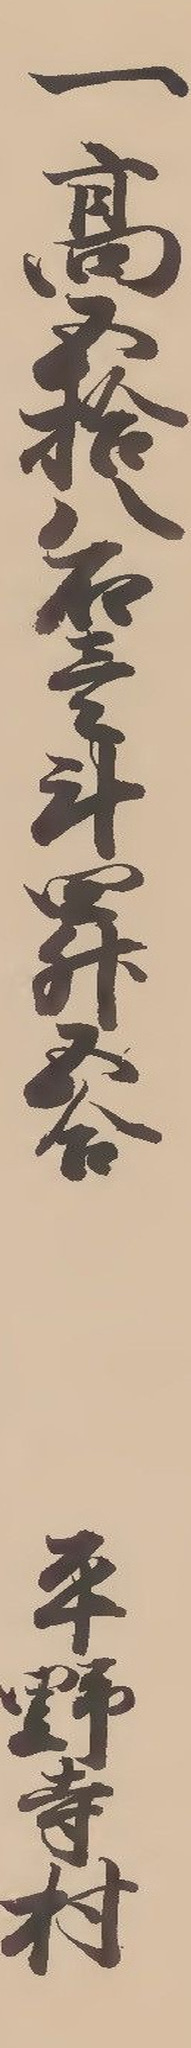一高五拾八石壱斗四升五合平野寺村
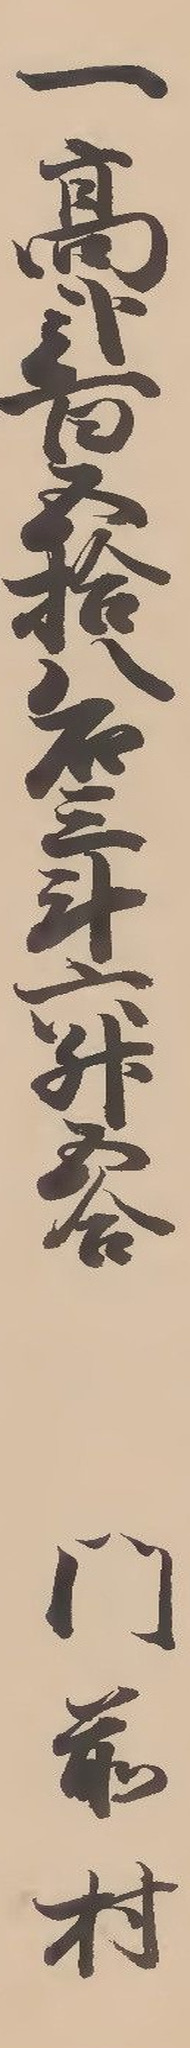一高弐百五拾八石三斗六升五合門前村
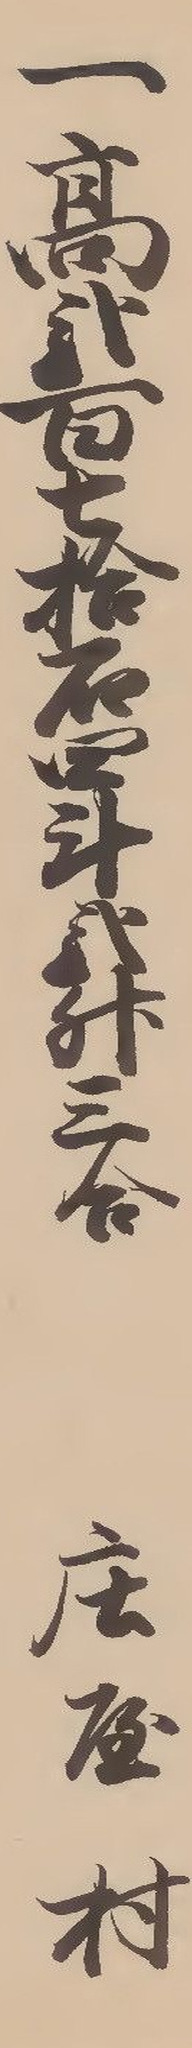一高弐百七拾石四斗弐升三合庄屋村
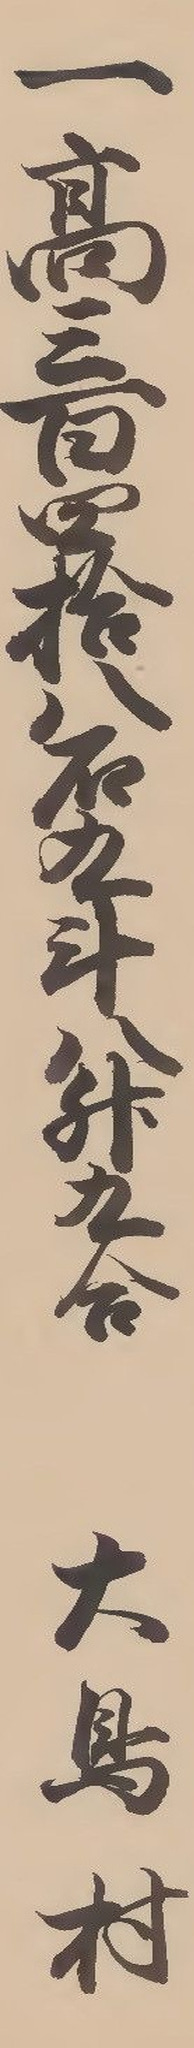一高三百四拾八石九斗八升九合大鳥村
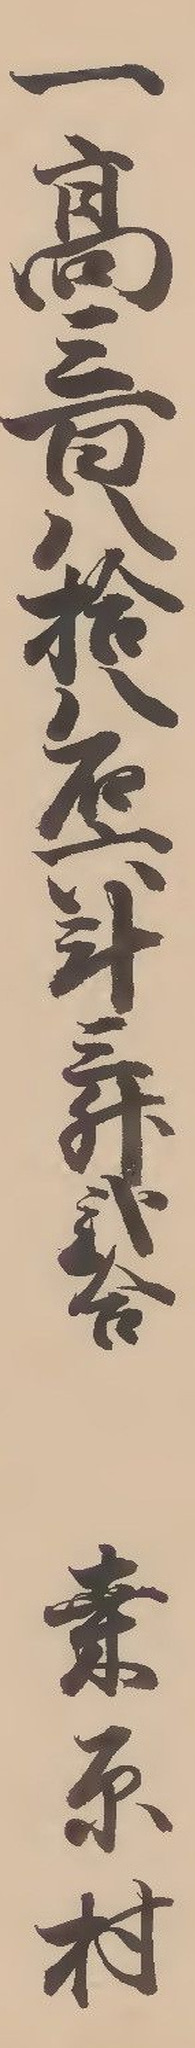一高三百八拾八石六斗三升弐合桑原村

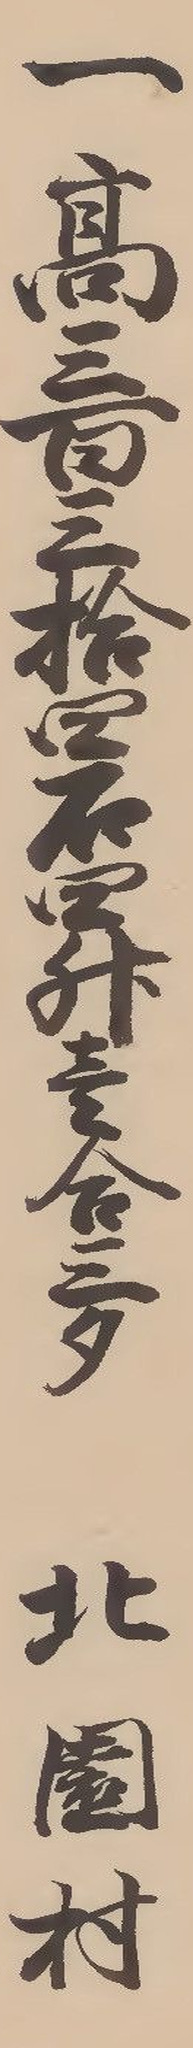一高三百三拾四石四升壱合三勺北園村
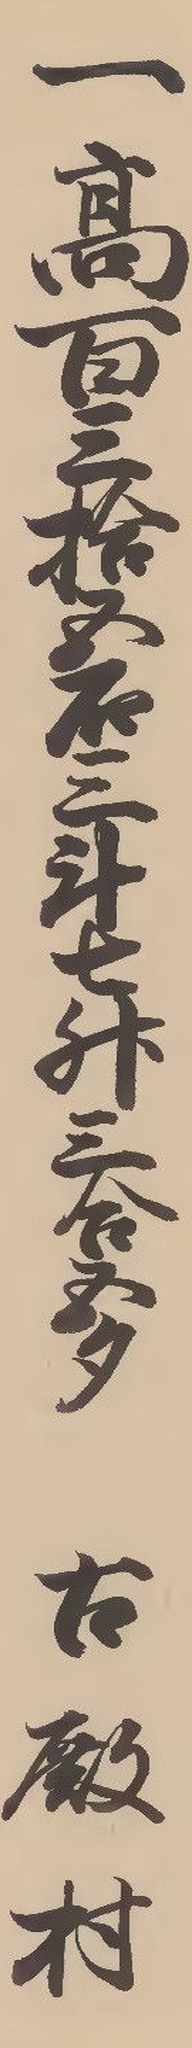一高百三拾五石三斗七升三合五勺古殿村
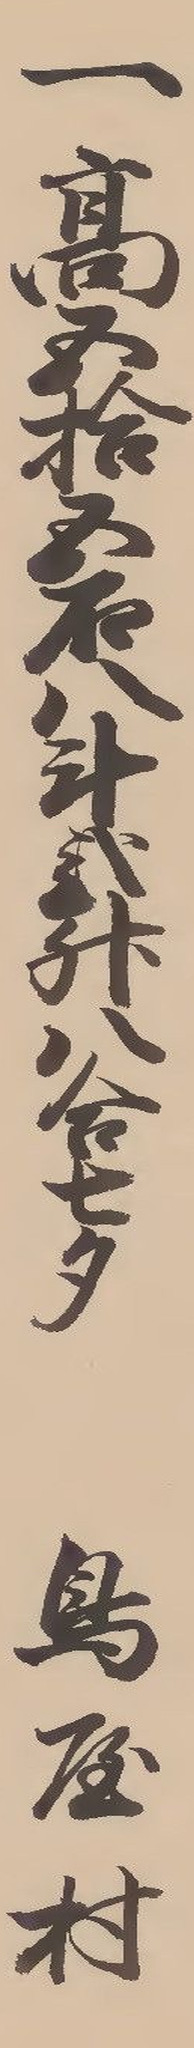一高五拾五石八斗弐升八合七勺鳥屋村
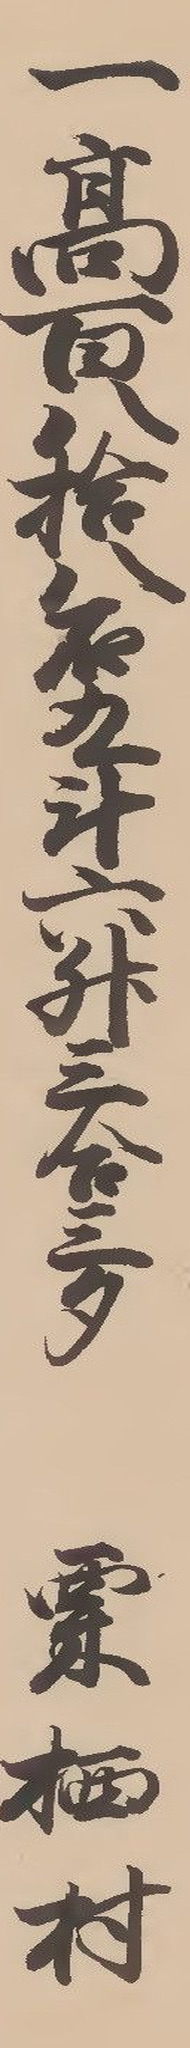一高百八拾八石九斗六升三合三勺栗栖村
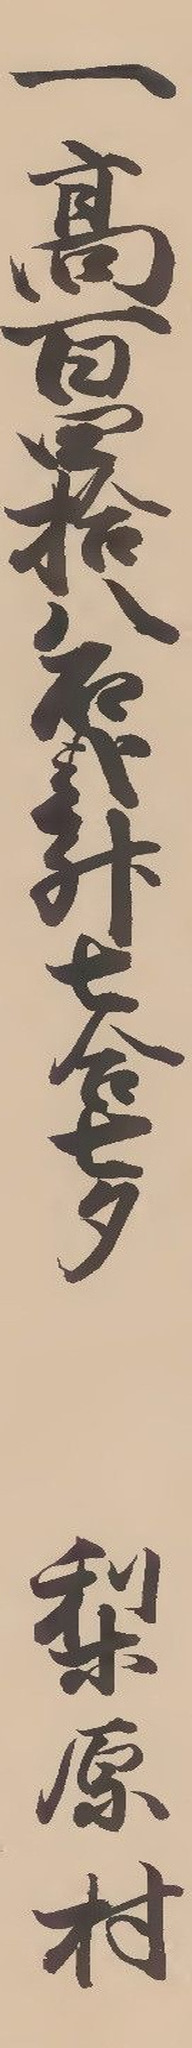一高百四拾八石弐升七合七勺梨原村
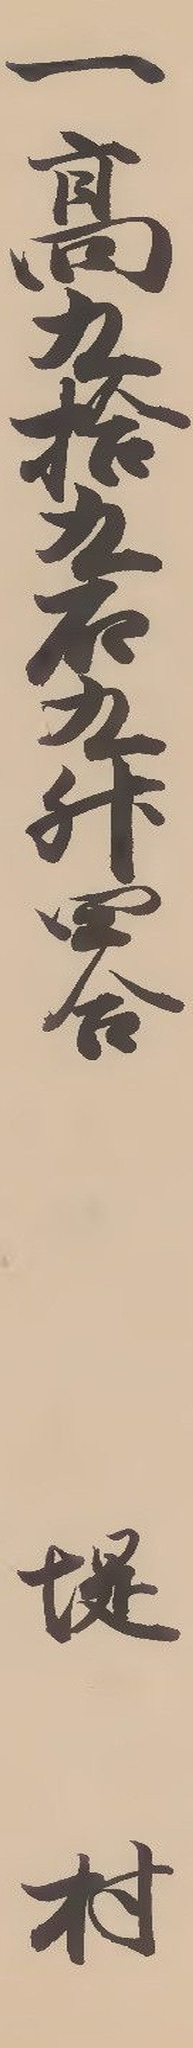一高九拾九石九升四合堤村
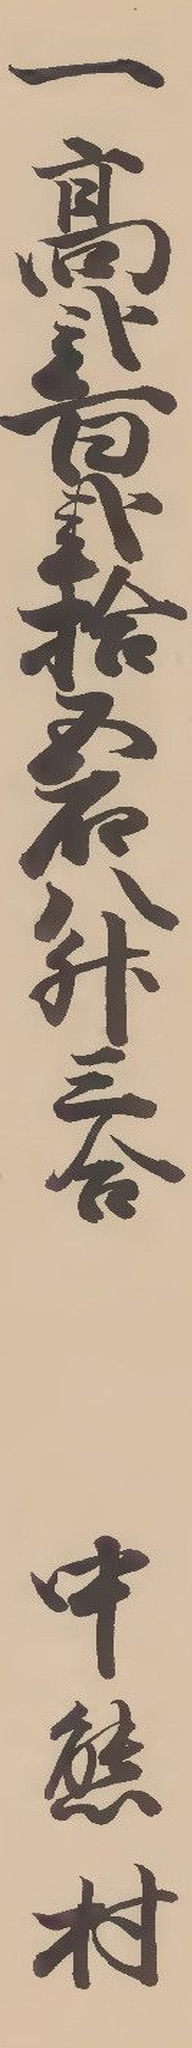一高弐百弐拾五石八升三合中熊村
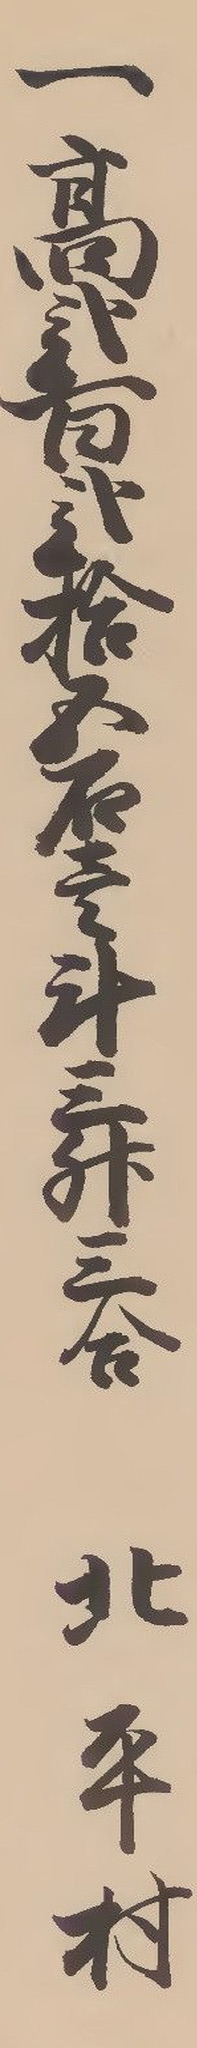一高弐百弐拾五石壱斗三升三合北平村

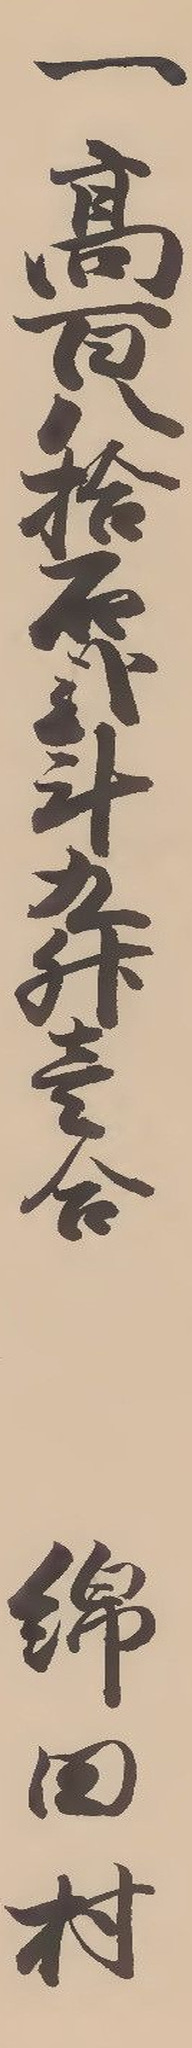一高百八拾石弐斗九升壱合綿田村
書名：豊後国郷帳
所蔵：国立公文書館 National Archives of Japan
